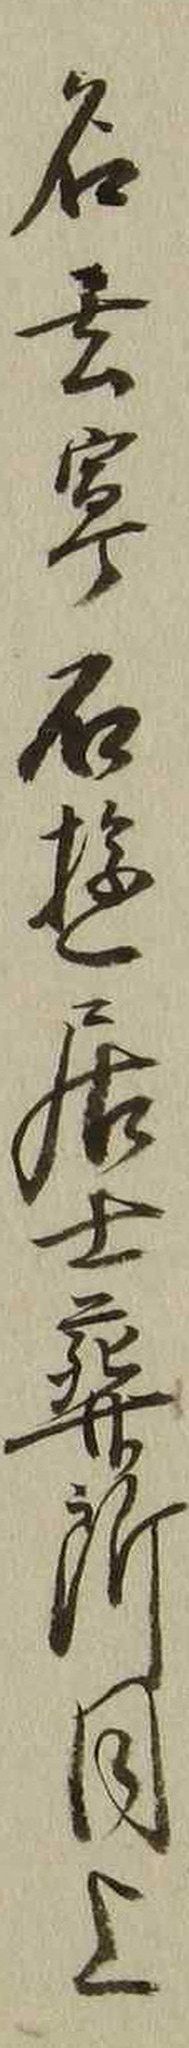名玄寧石遊居士葬所同上
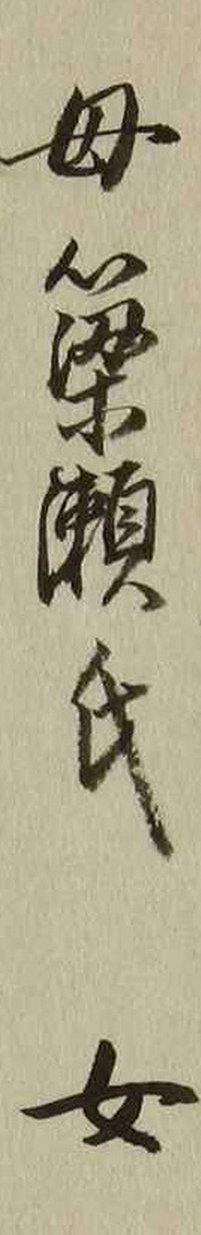母簗瀬氏女
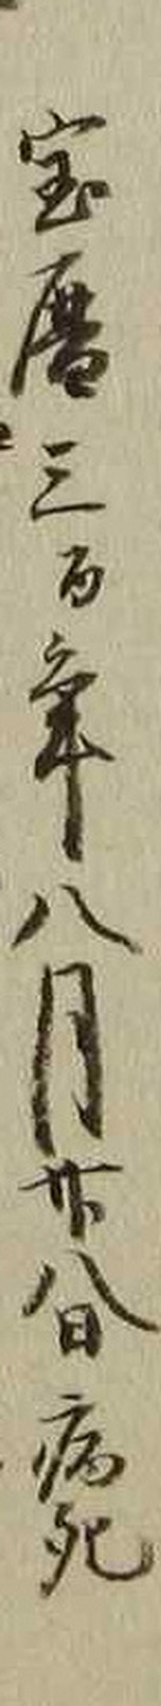宝暦三酉年八月廿八日病死
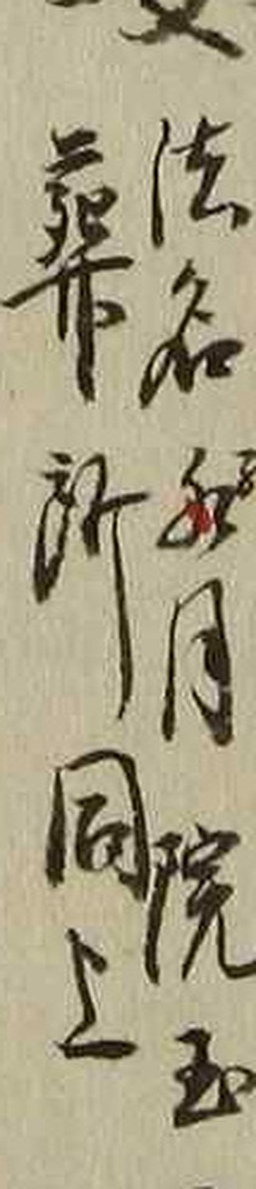葬所同上
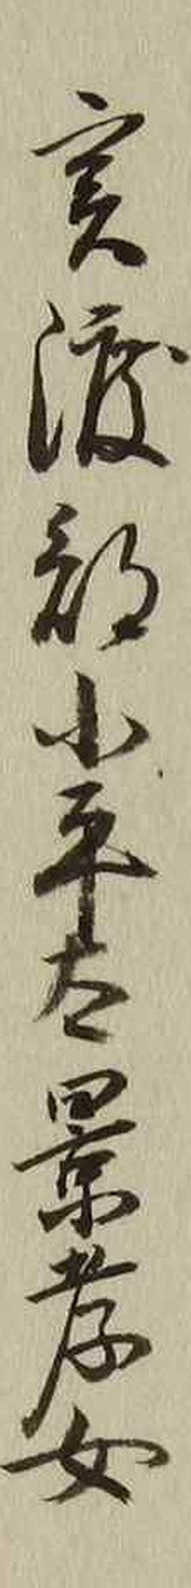実渡部小平太景孝女
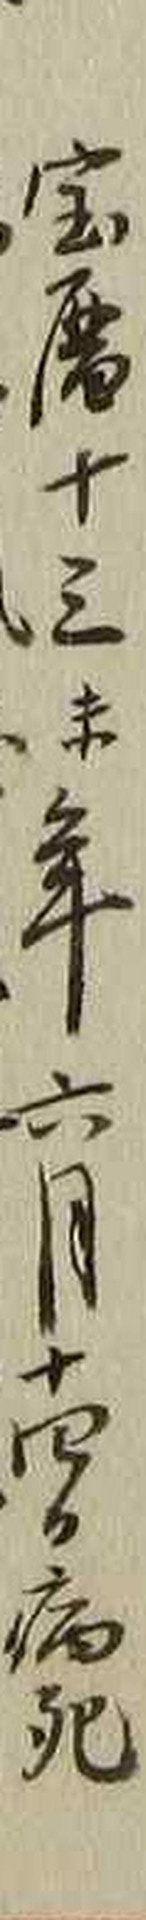富暦十三未年六月十四日病死
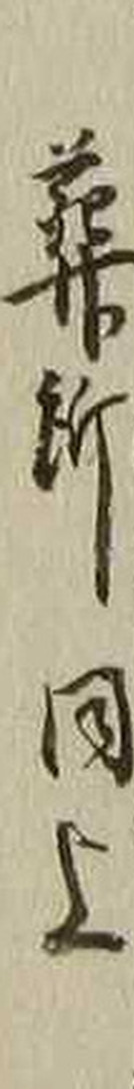葬所同上
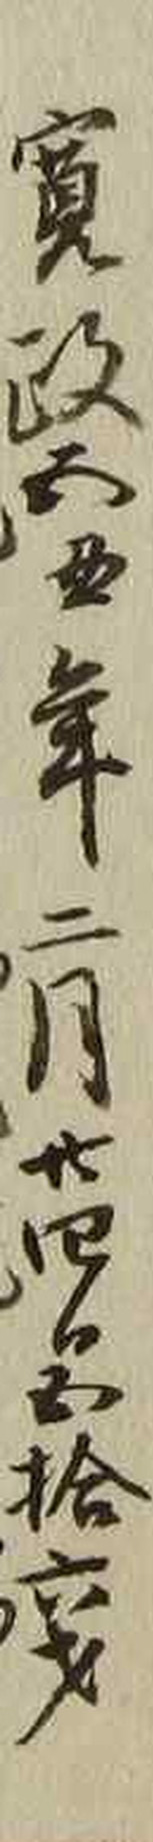寛政五丑年二月廿四日五拾六才
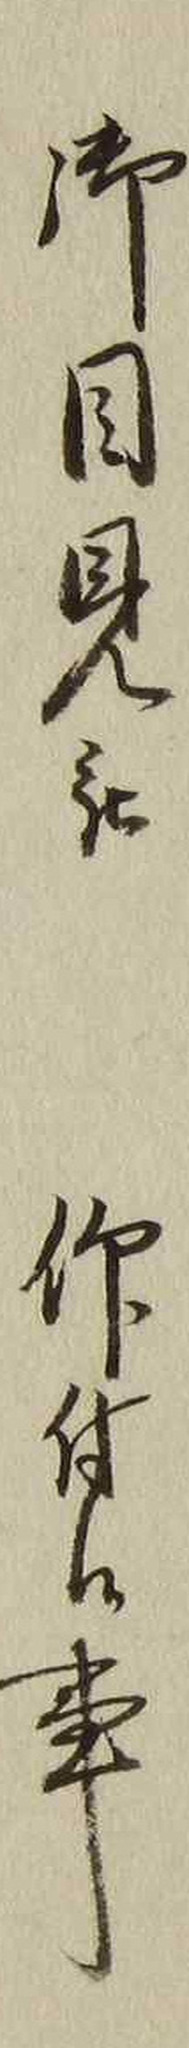御目見被仰付候事
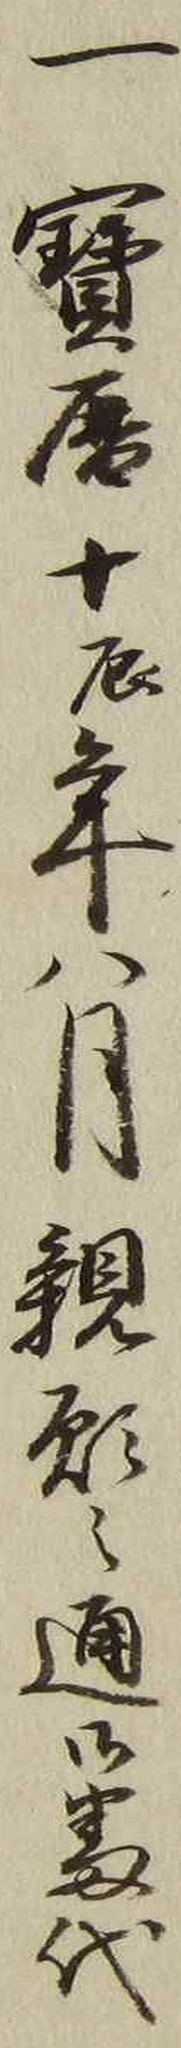一宝唐十辰年八月親願之通御番代
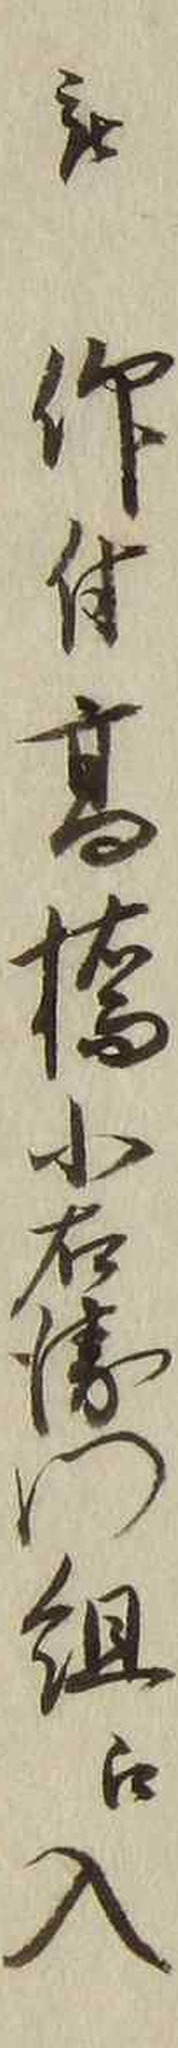被仰付高橋小右衛門組江入
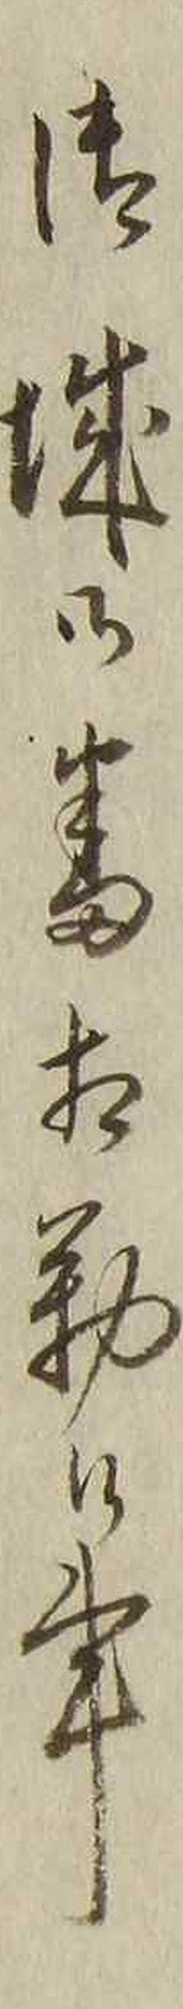御城御番相勤候事

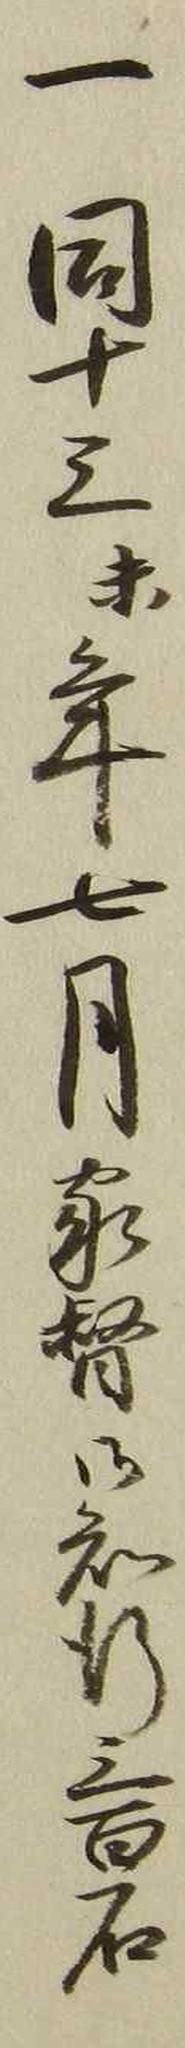一同十三未年七月家督御知行三百石
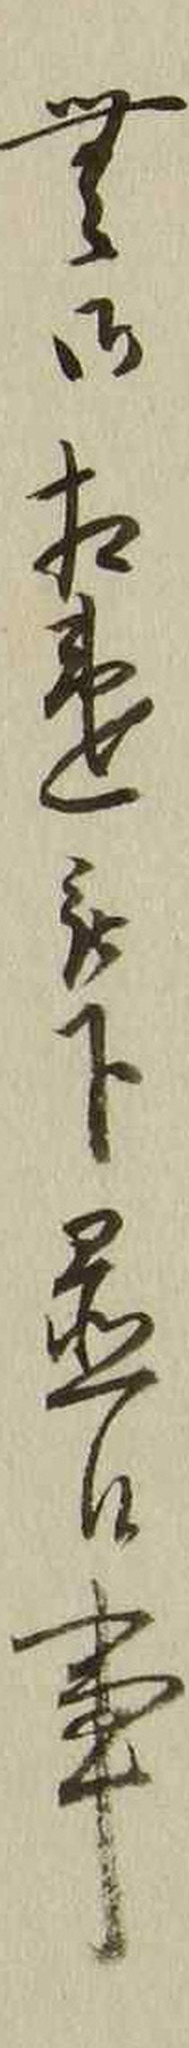無御相違被下置候事
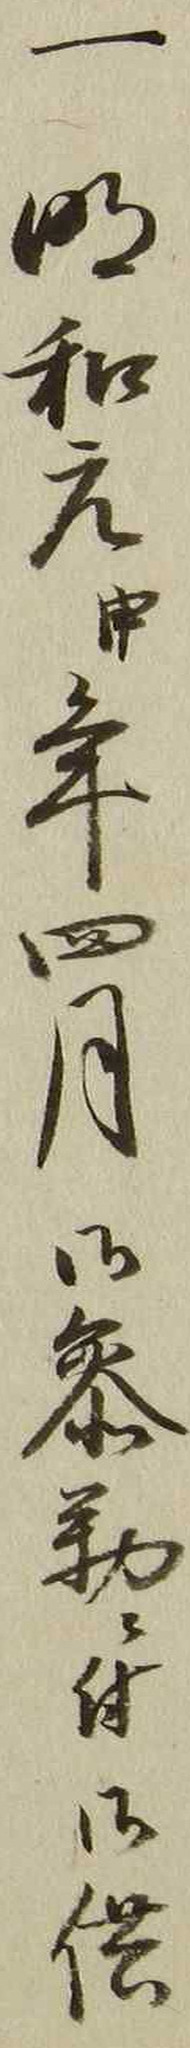一明和元申年四月御参勤に付御供
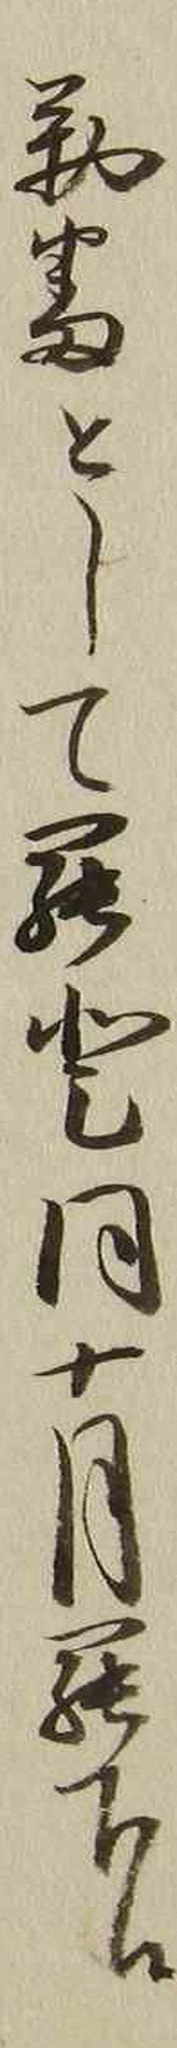勤番として罷登同十月罷下候
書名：諸士系譜　巻之133　た之部9
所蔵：会津若松市立会津図書館
